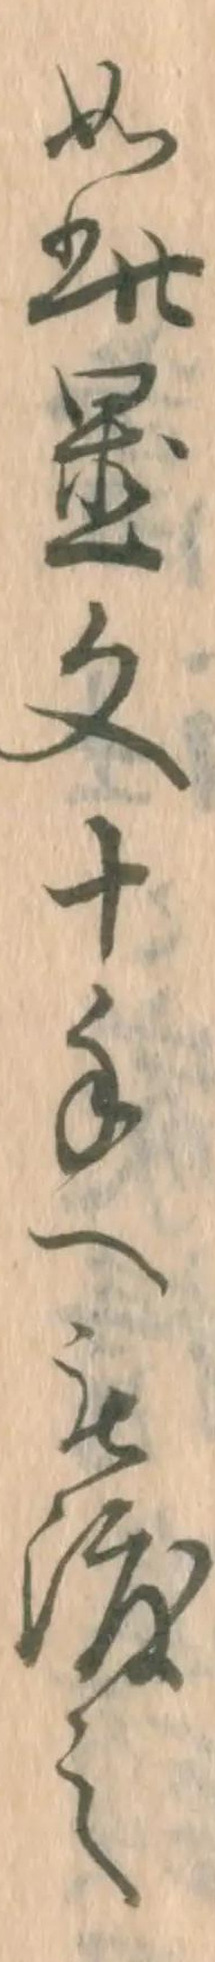如此置文十手へ被渡之
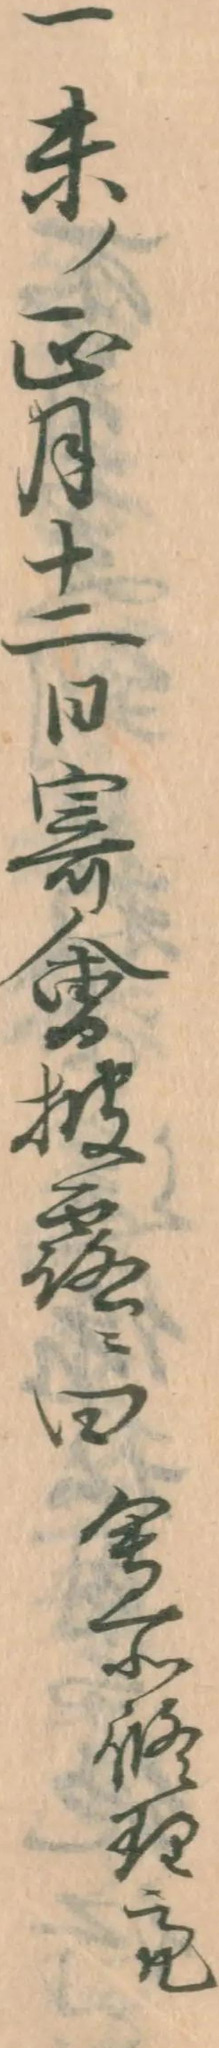一、未ノ正月十二日寄會披露ニ曰會所修理亮
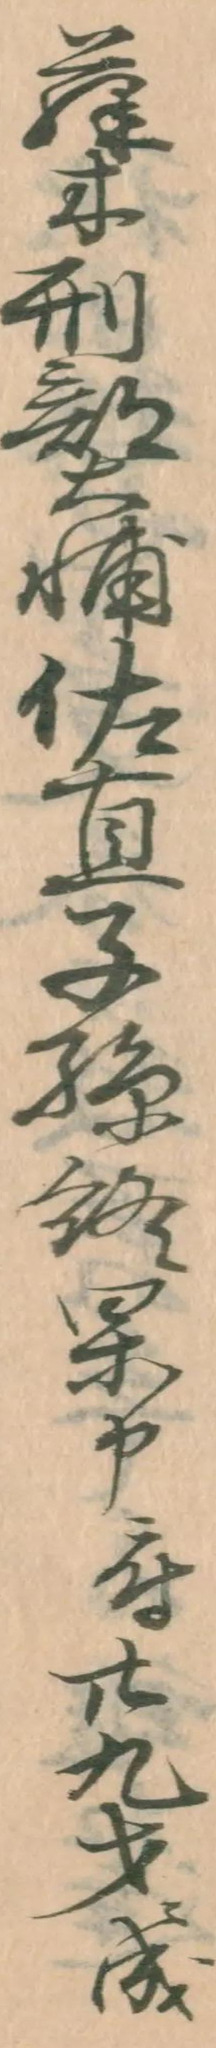藤木刑部大輔佐直子孫終果申ニ付廿九才ニ成
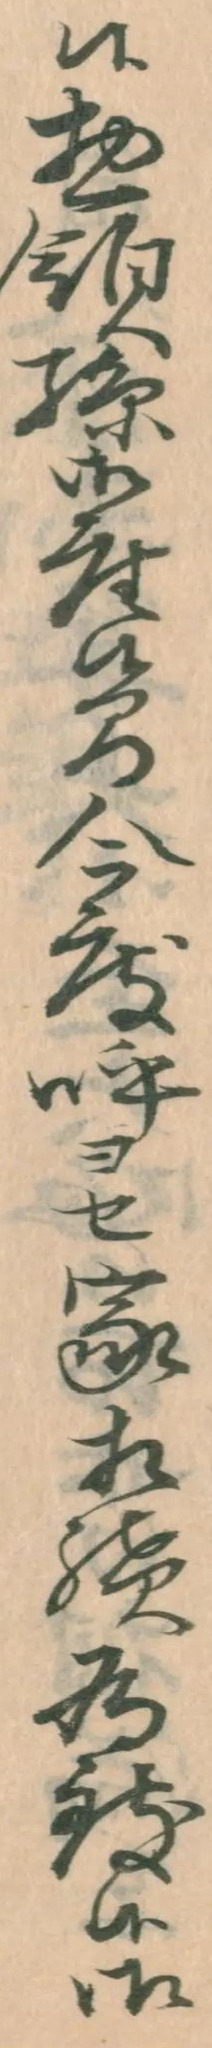候惣領へ孫御座候間今度呼ヨセ家相続為致候御
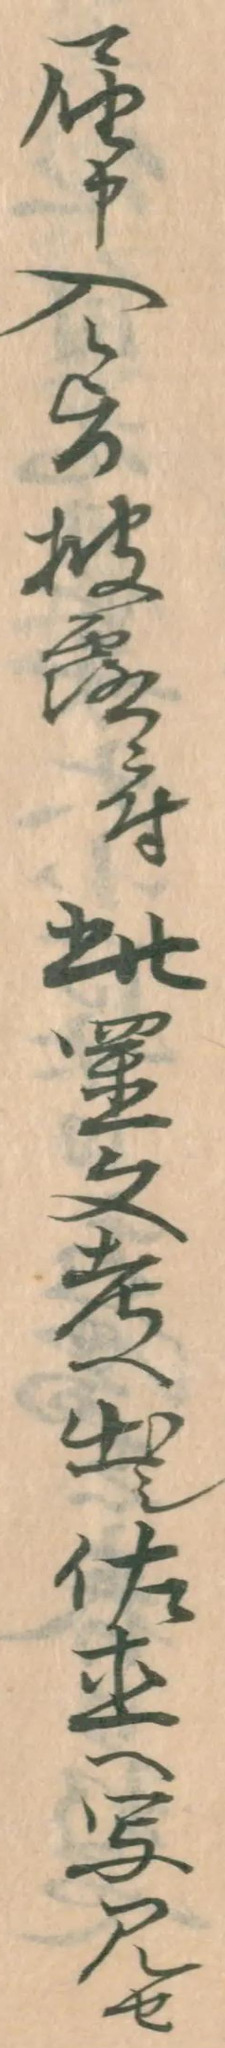届申入候旨披露ニ付此置文考へ出シ佐直へ写見セ
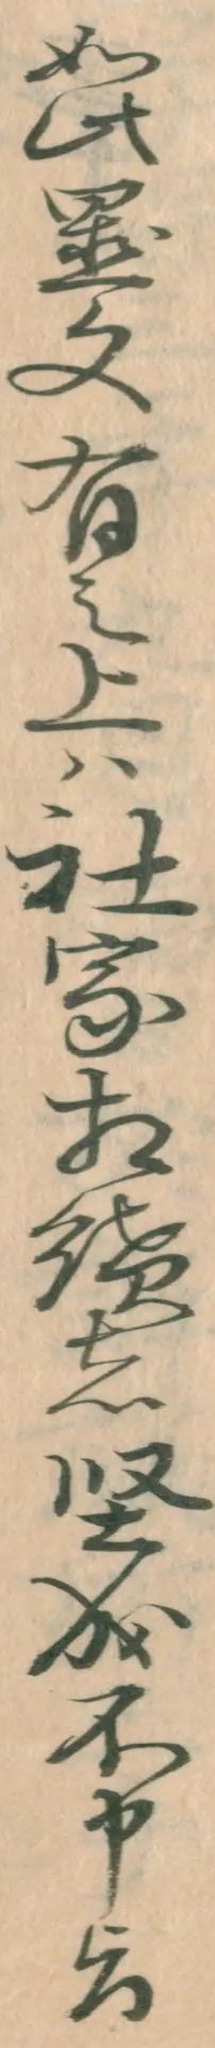如此置文有之上ハ社家相続者堅成不申旨
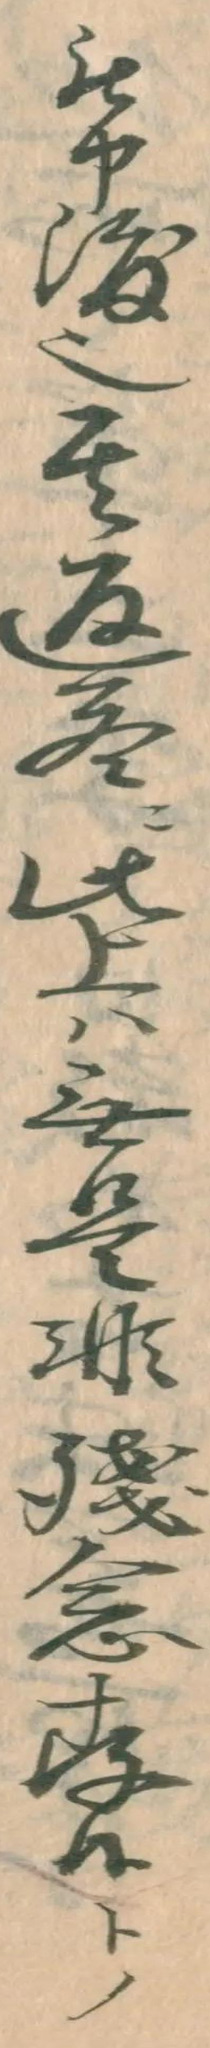被申渡也其返答ニ此上ハ無是非残念存候トノ

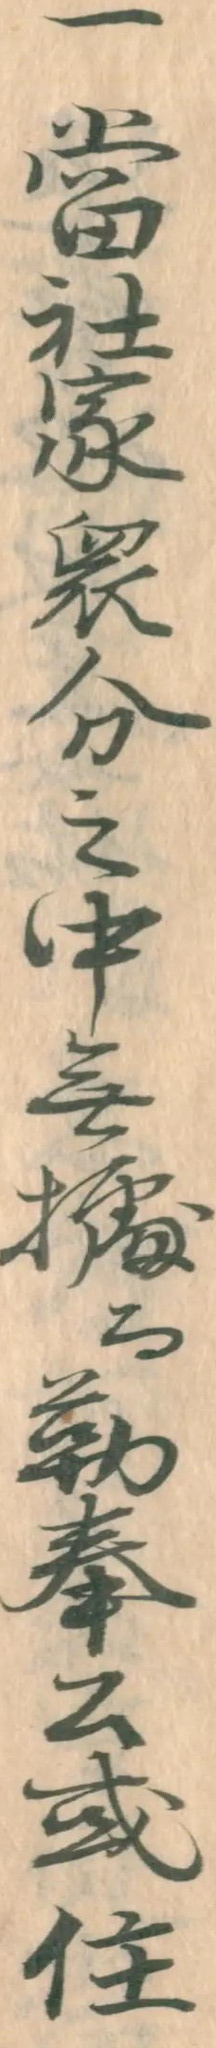一、當社家衆分之中無拠而勤奉公或住
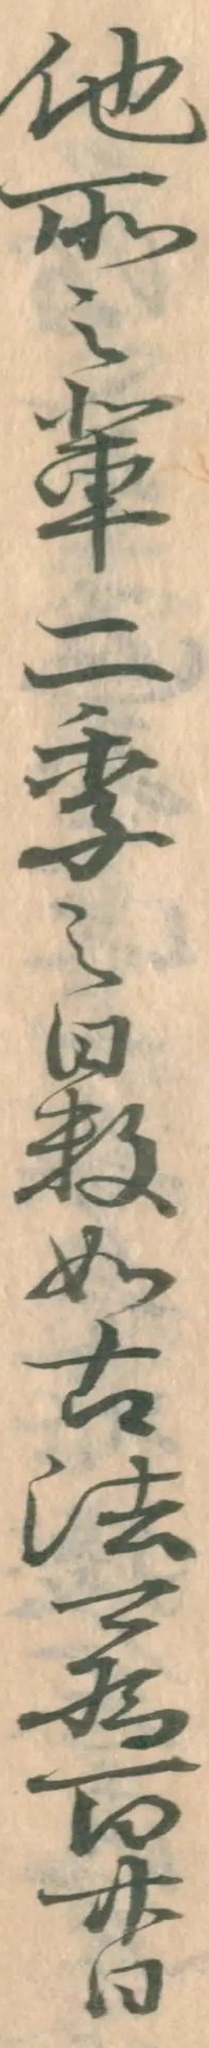他所之輩二季之日数如古法可為百廿日
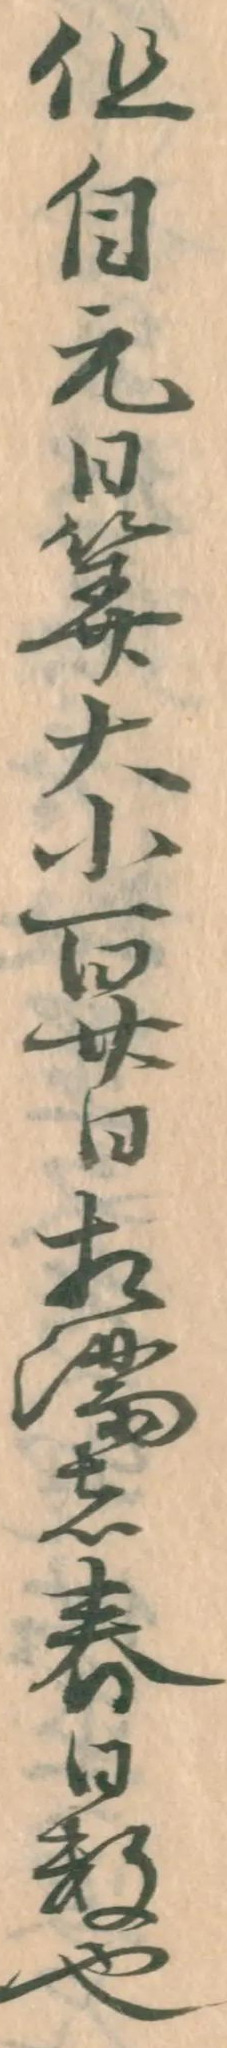但自元日算大小百廿日相満者春日数也
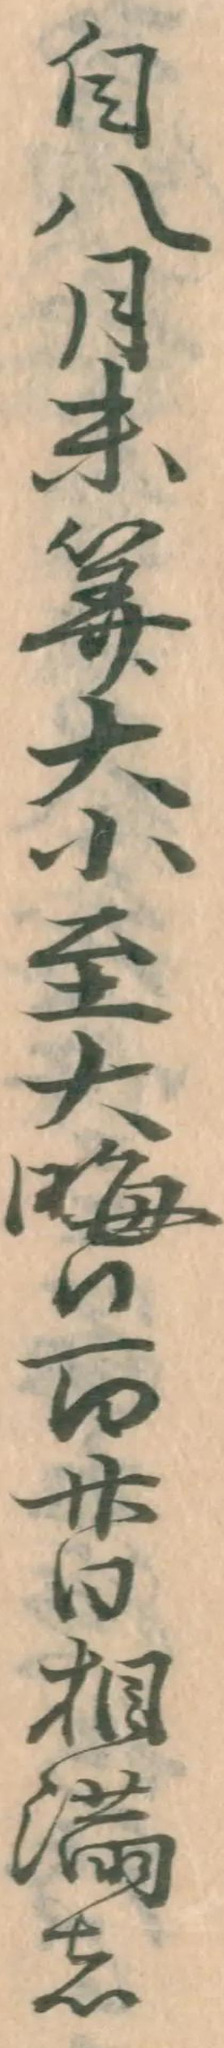自八月末算大小至大晦日百廿日相満者
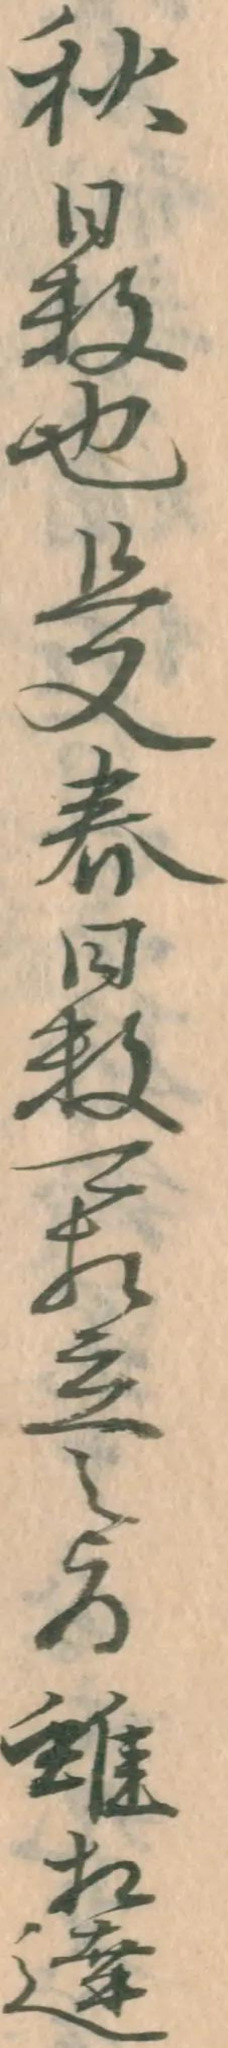秋日数也且又春日数可相立之旨雖相達
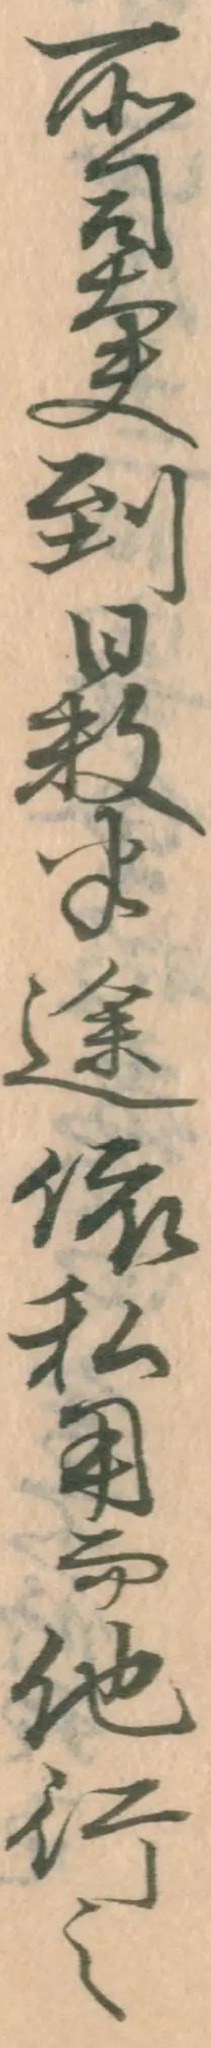所司大夫到日数半途依私用而他行之
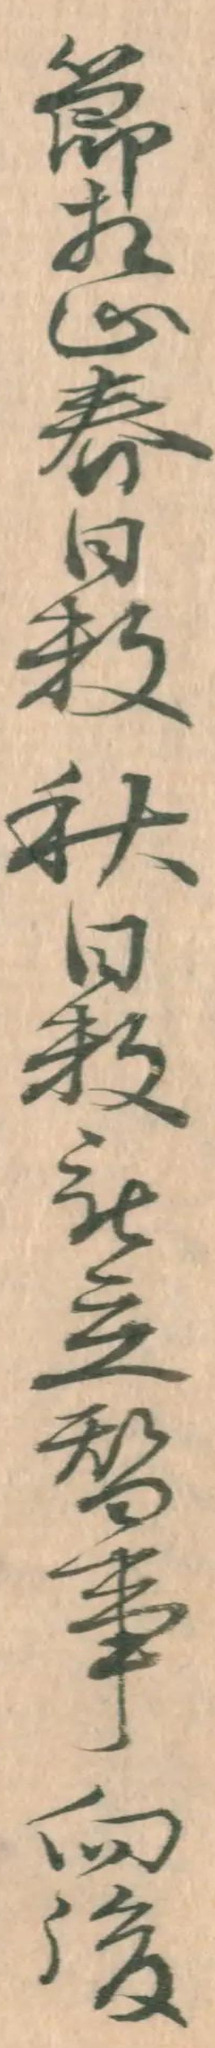節相止春日数秋日数被立替事向後
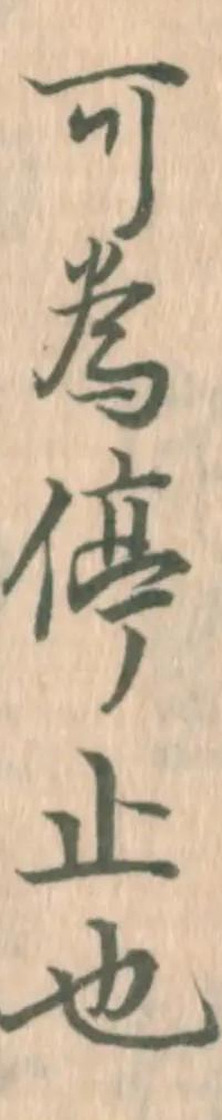可為停止也
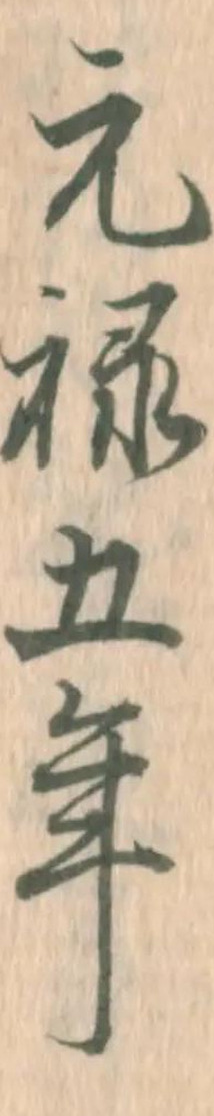元禄五年
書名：賀茂社記録. 第39冊
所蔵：国立国会図書館 National Diet Library, JAPAN
